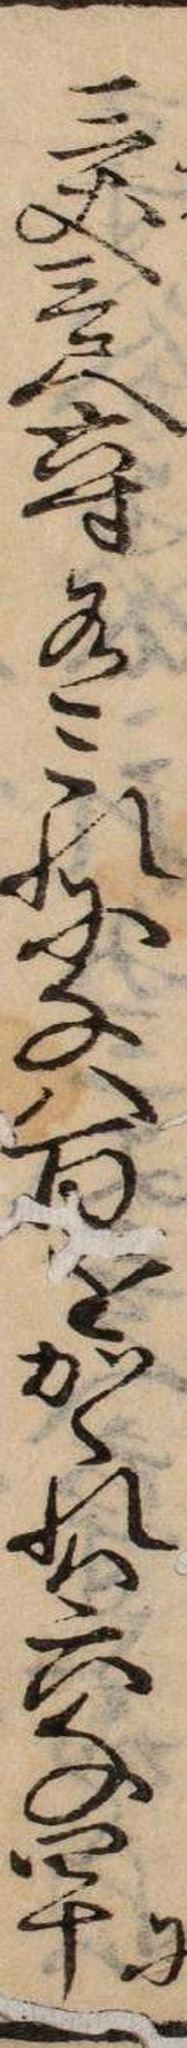三丈三尺六寸有これに千八百をかくれは六千四十
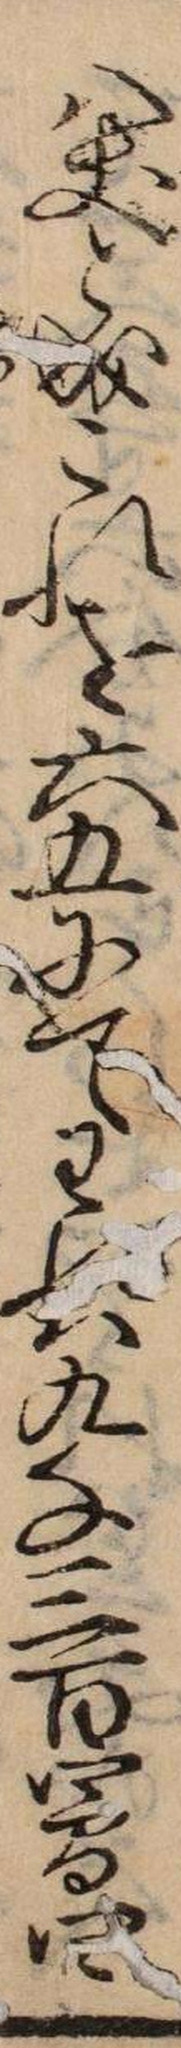八丈と成これを六五にてわれは九千三百四間四
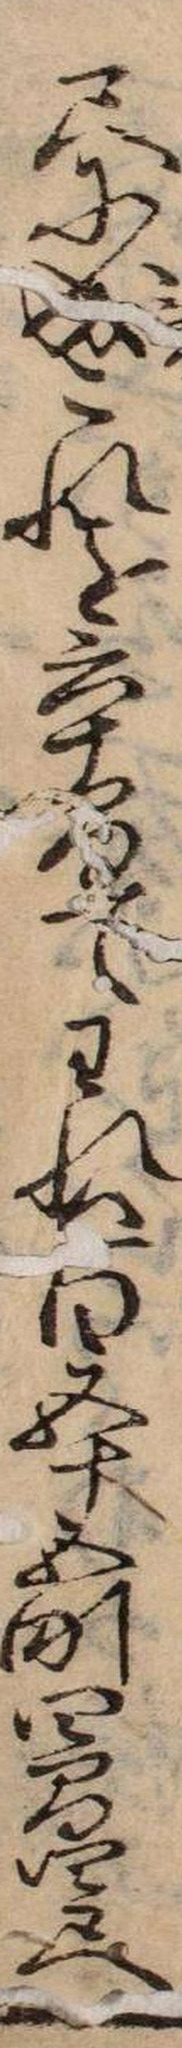尺に成これを六十間てわれは百五十五町四間四尺
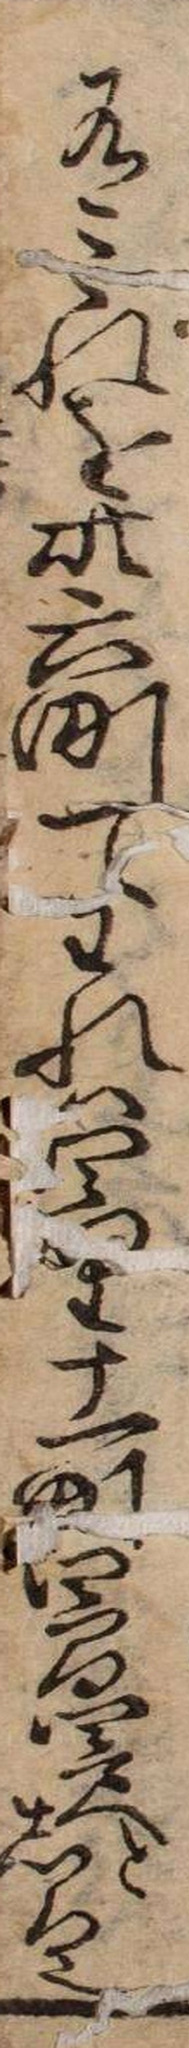有これを卅六町てわれは四里十一町四間四尺としる也

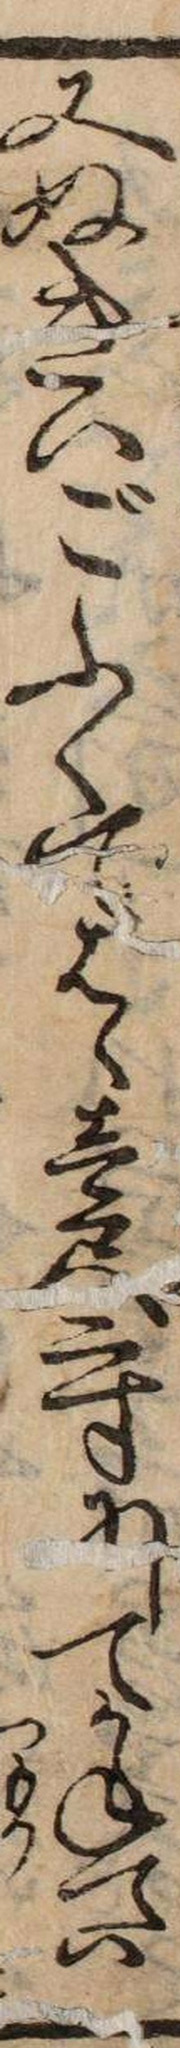又ぬきはごふくてはは壱尺二寸にしてかねては
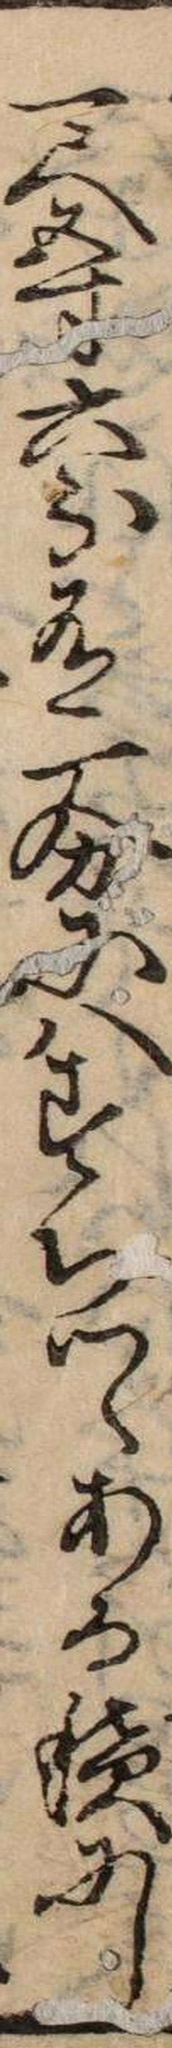一尺五寸六分有一分にはすちつつある積にし
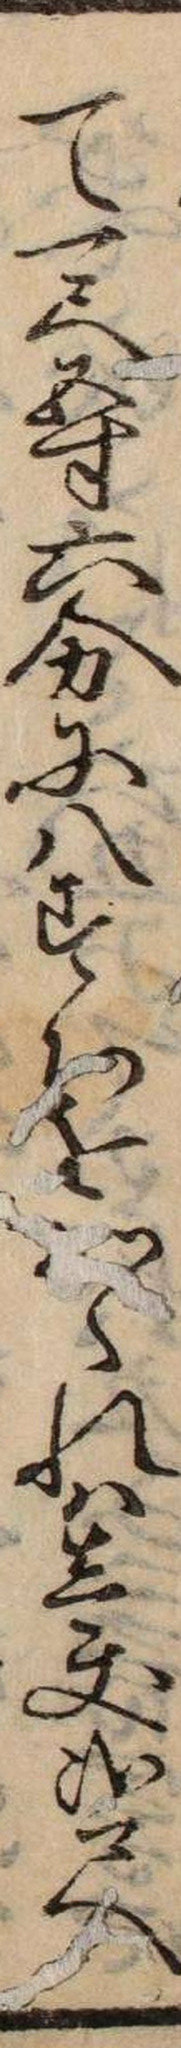て一尺五寸六分に八すちをつくれは壱丈弐尺
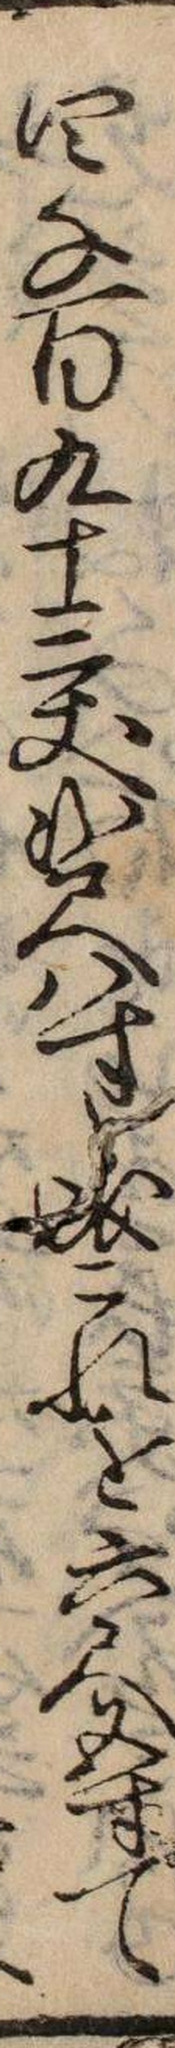四千百九十三丈弐尺八寸と成これを六尺五寸て
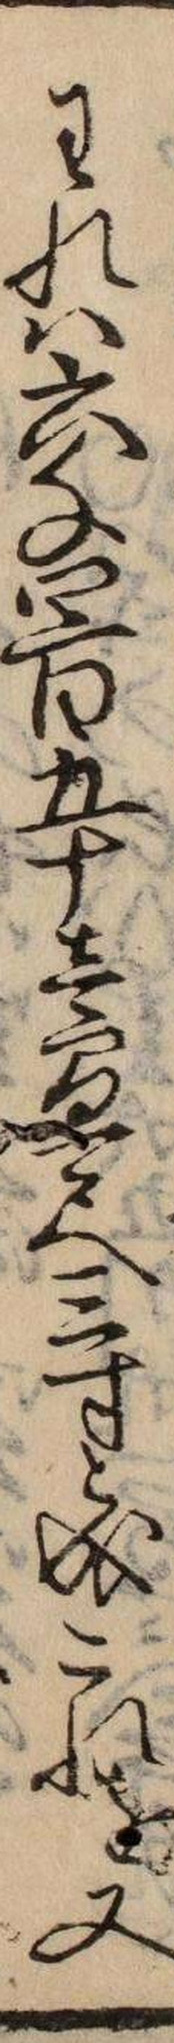われは六千四百五十壱間一尺三寸と成これを又
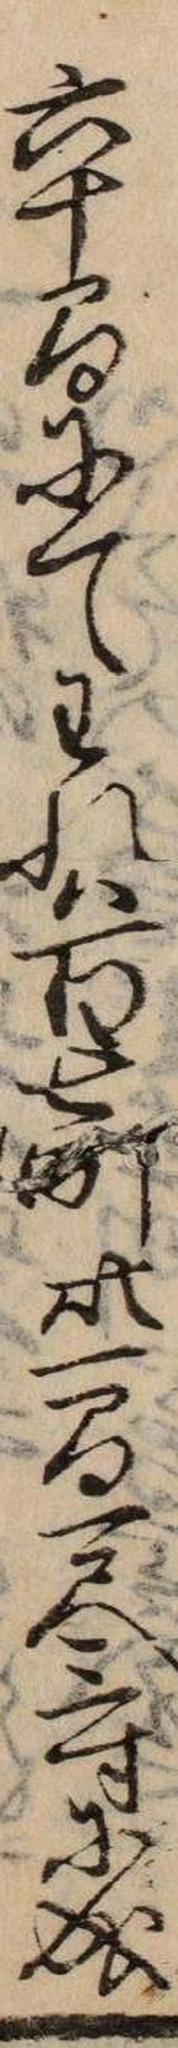六十間にてわれは百七町卅一間一尺三寸に成
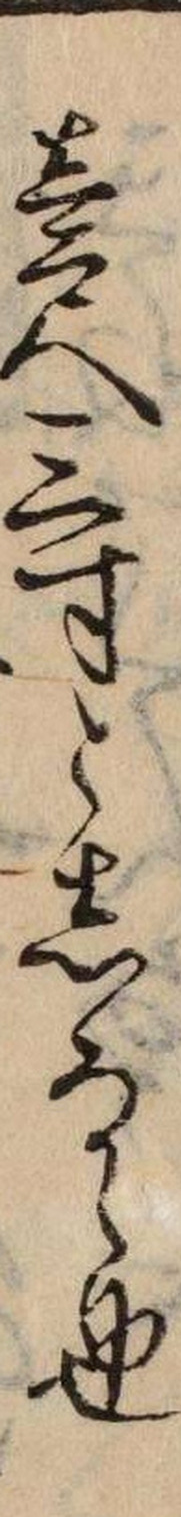壱尺三寸としるる也
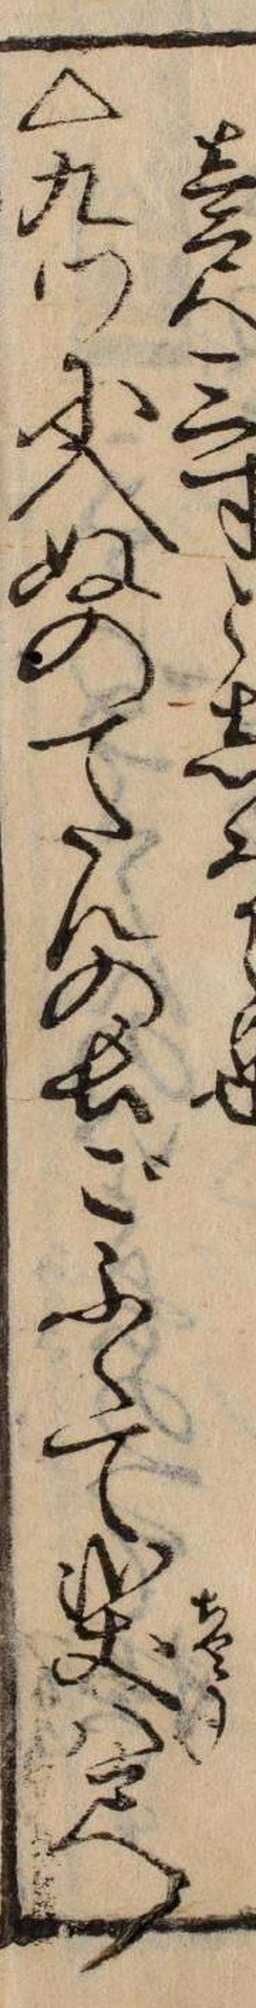△九つに入ぬのてたんの長ごふくて弐丈八尺
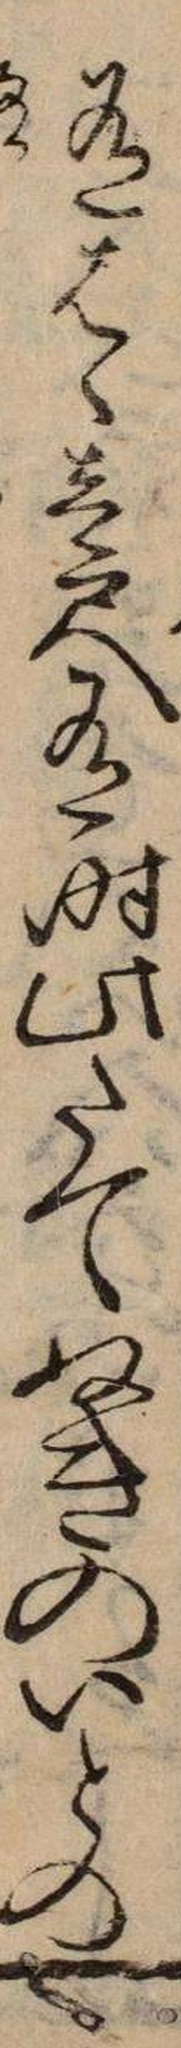有はは壱尺有時此たてぬきのいとの
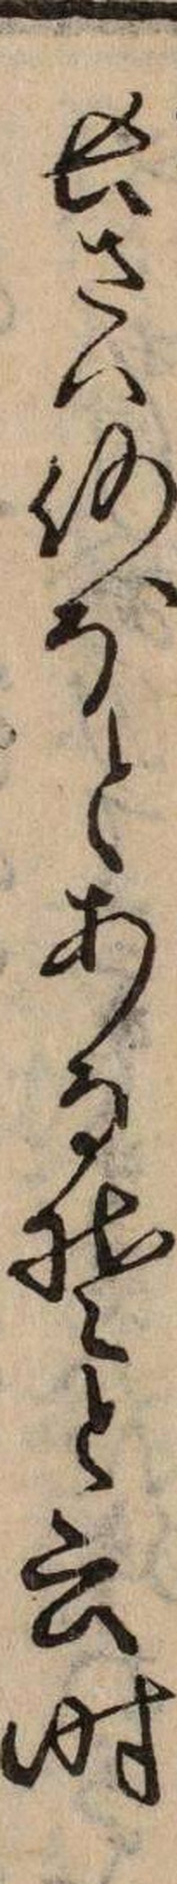長さは何ほとあるそと云時
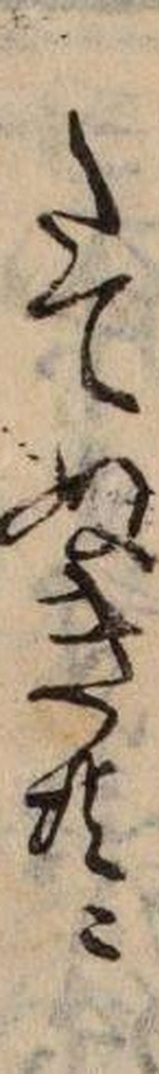たてぬき共に
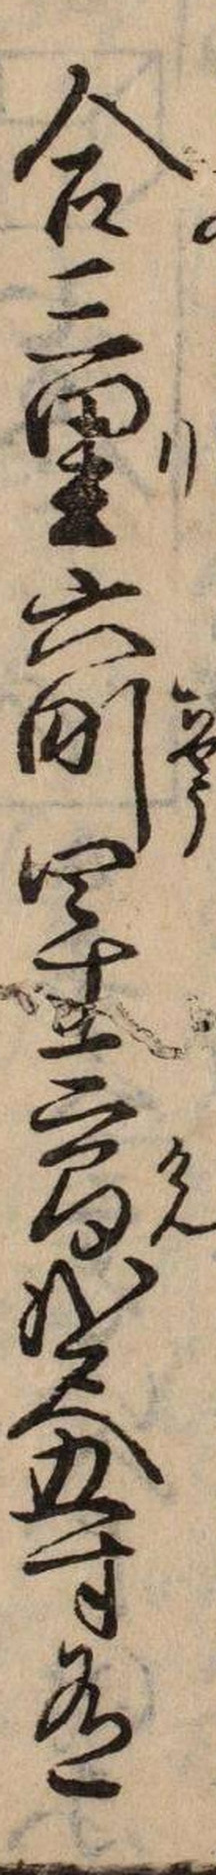合三里六町四十二間弐尺五寸有
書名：塵劫記（寛永11年自跋、京都府立京都学・歴彩館追貴8）
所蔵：京都府立京都学・歴彩館 国文学研究資料館
